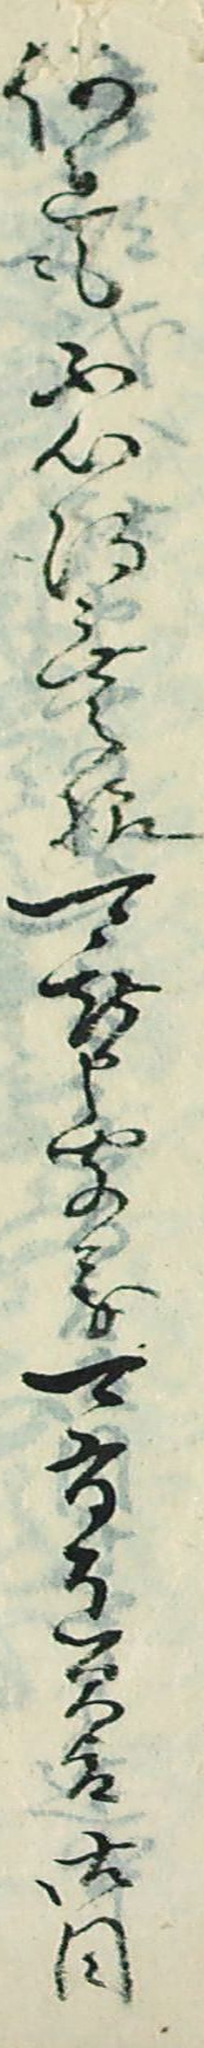何れも不心得無之様可被申聞義可有了簡旨御目
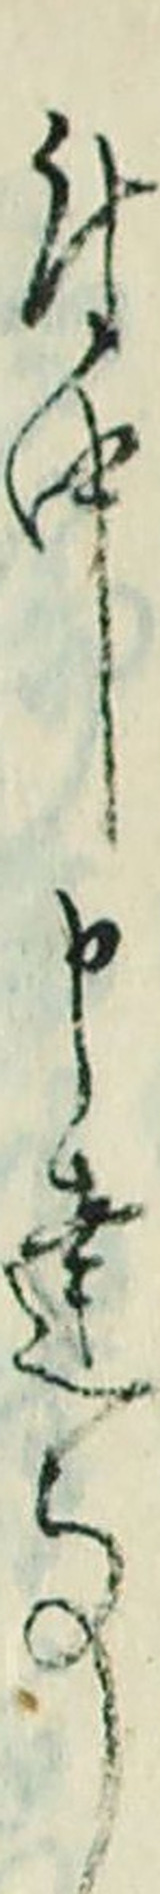付中申達事
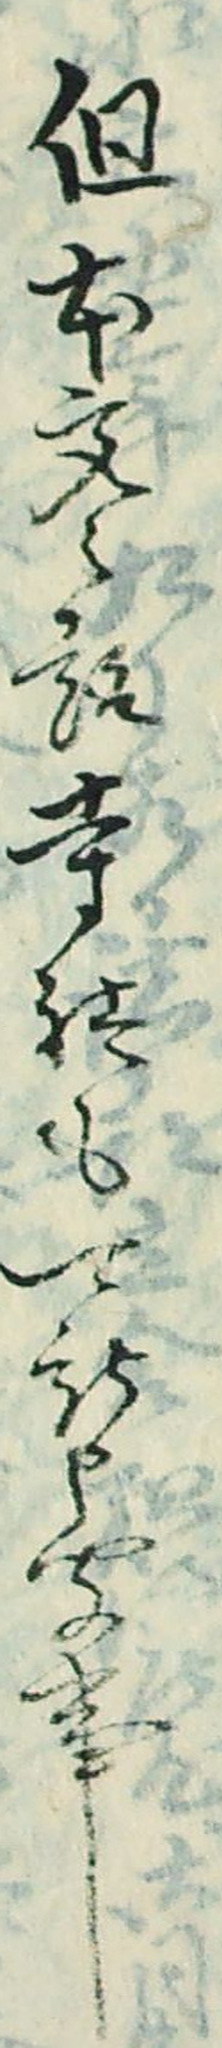但本文之趣寺社へも可被申聞事

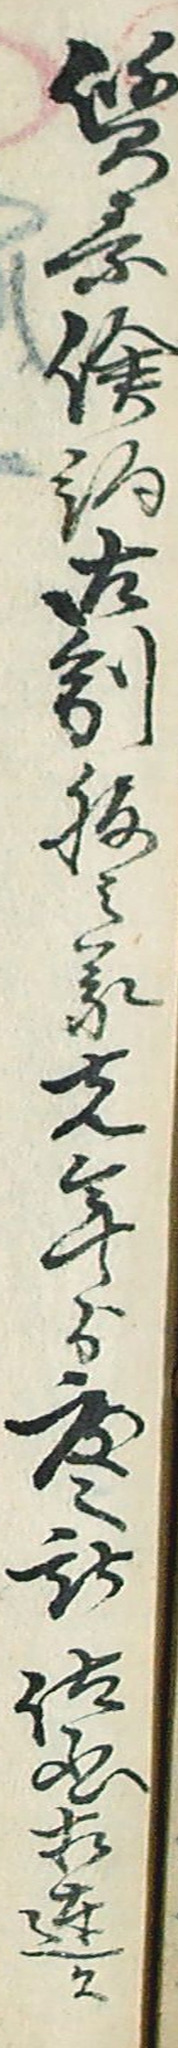質素倹約御制服之義先年ゟ度々被御書相達候
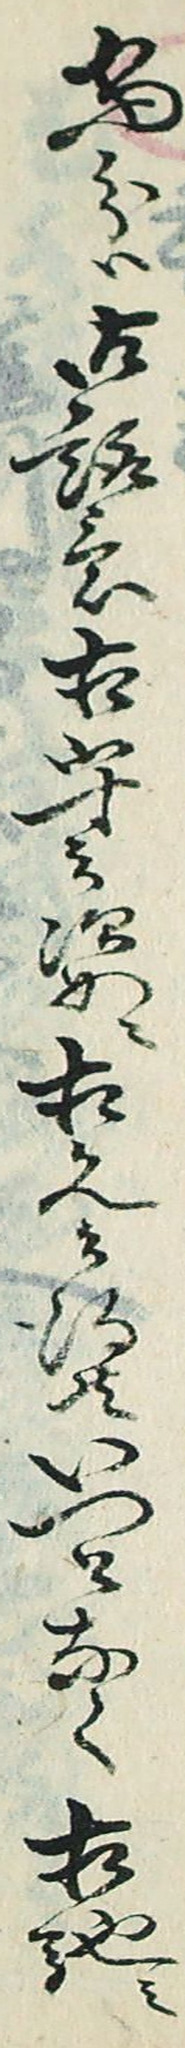當分ハ御趣意相守候姿ニ相見候得共いつとなく相弛ミ
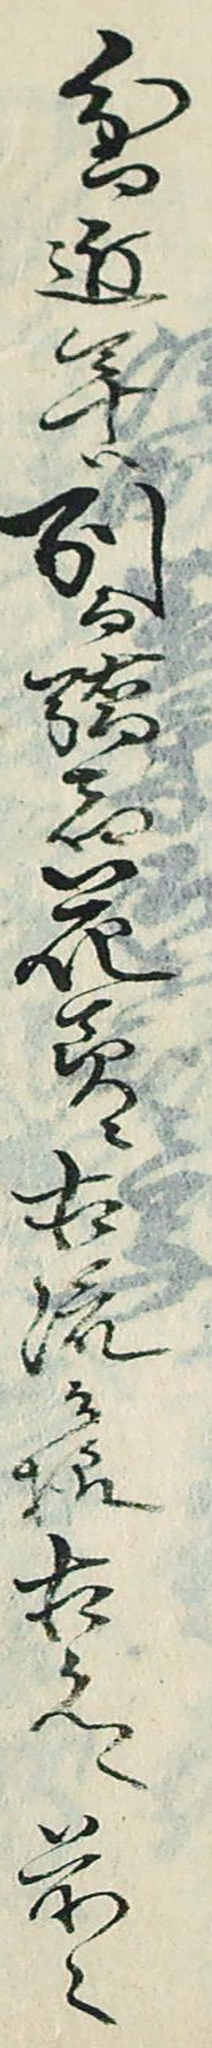分而近年ハ別而驕者花美ニ相流候様相見へ前々
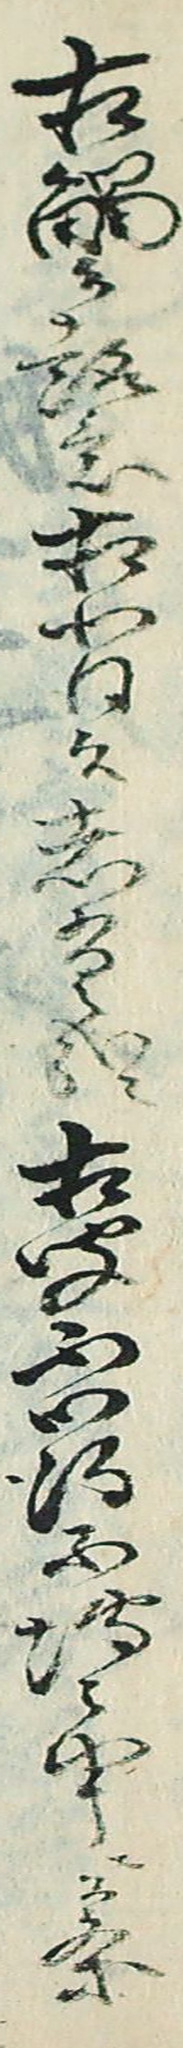相觸候御趣意相背候者有之哉ニ相聞不心得不埒之事ニ候条
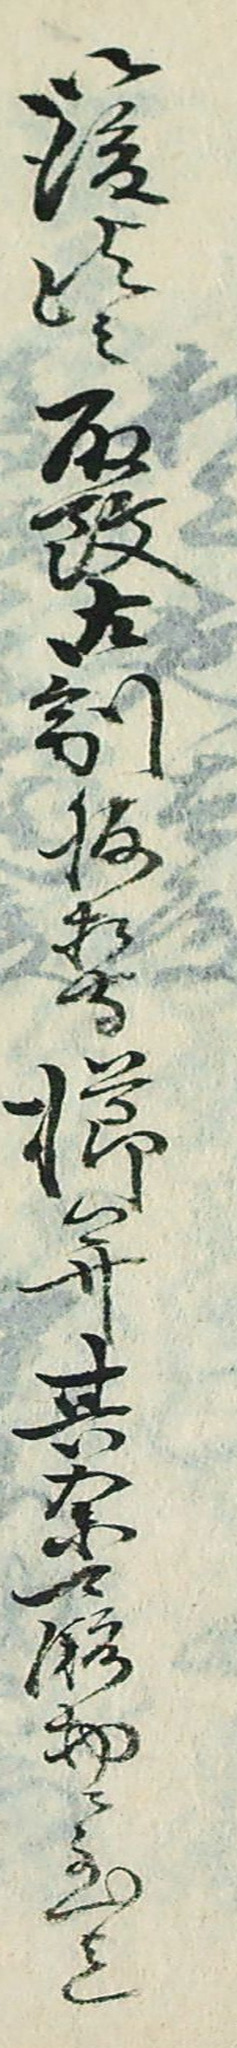以後屹と取改御制服相守櫛笄其余履物ニ至迄
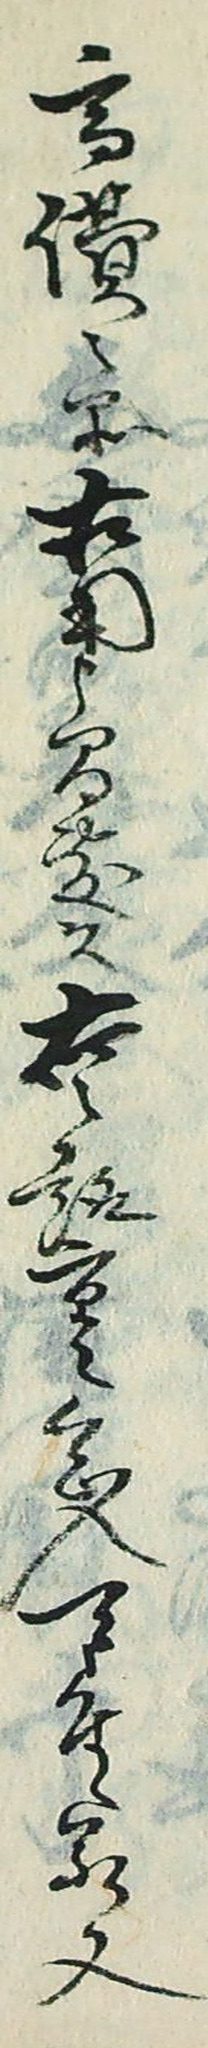高價之品相用申間敷候右之趣重々念入可申付候義又
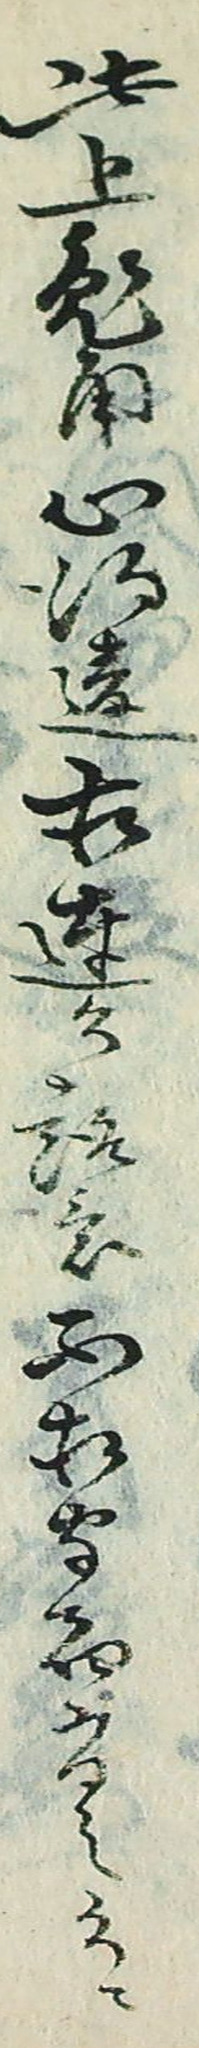此上兎角心得違相達候御趣意不相守者有之候ニ
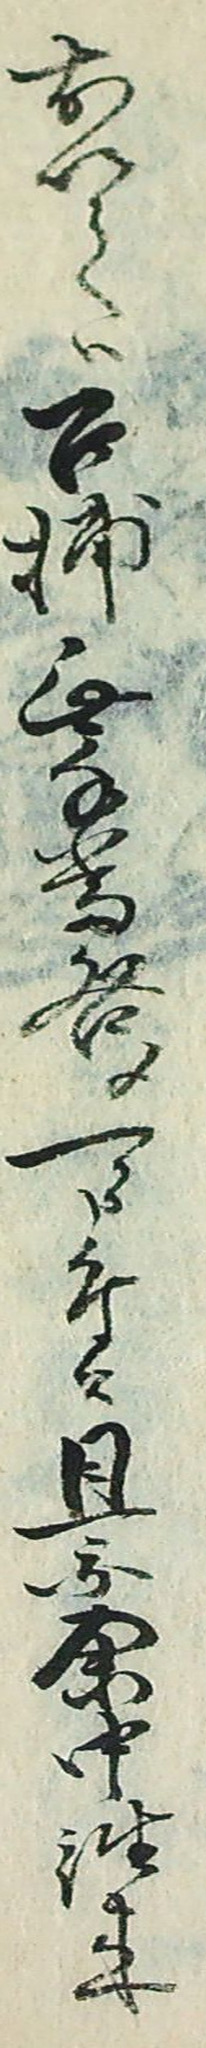おいてハ召捕無手當咎メ可申付候且亦余中往来
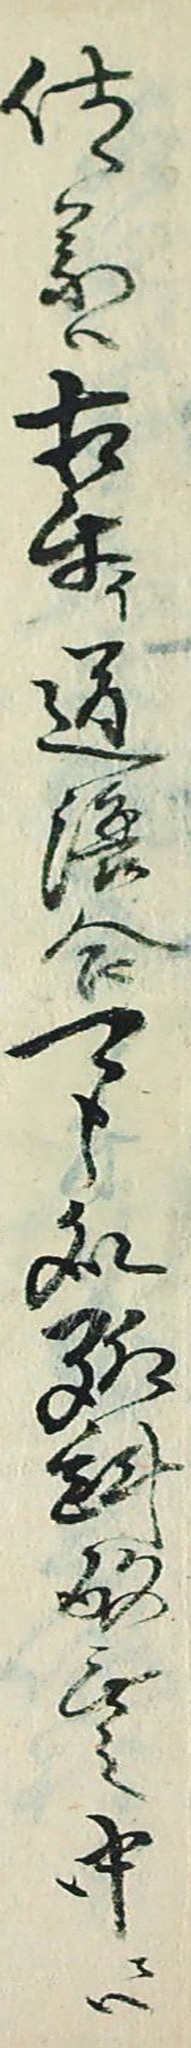仕候義ハ相互イ道譲合可申処聊斟酌無之中ニハ
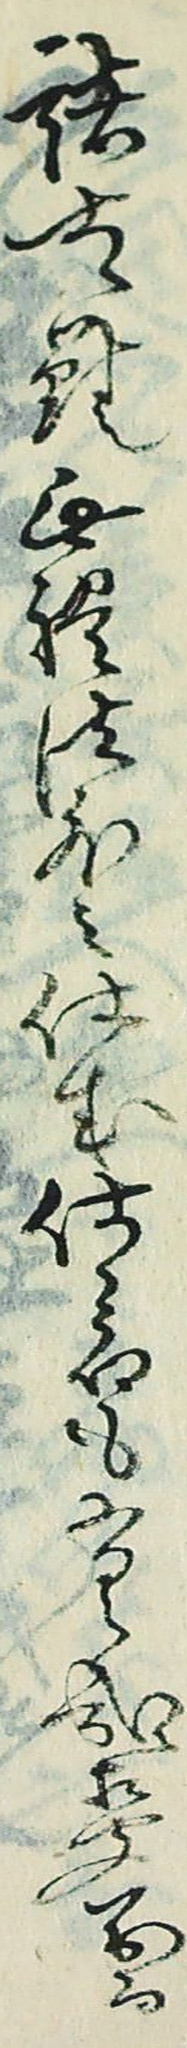諸士へ對シ無禮法外之仕成仕候者も有之哉ニ相聞別而
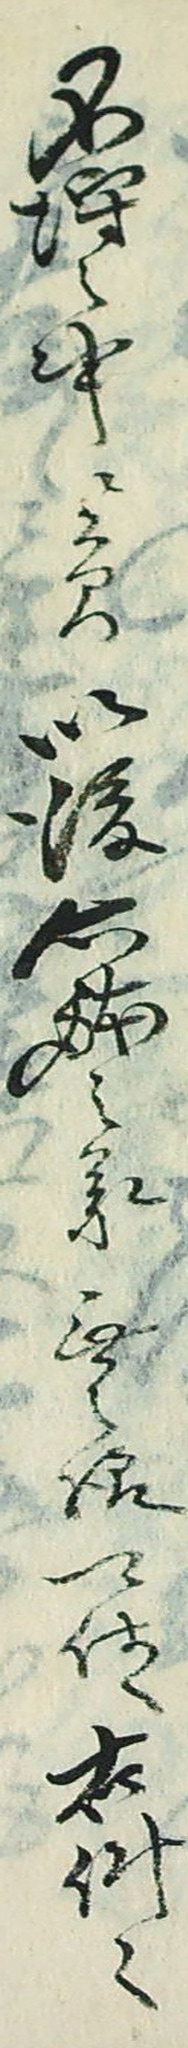不埒之事ニ候間以後右躰之義無之様可仕候右件々
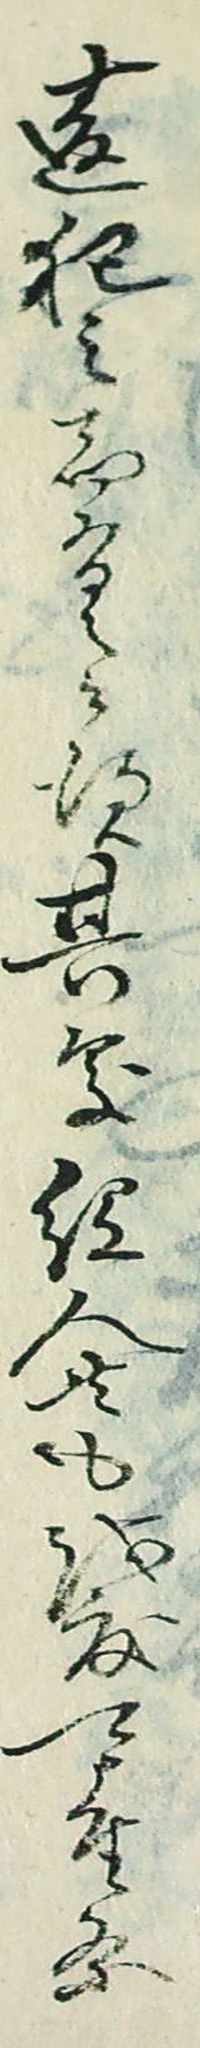違犯之者有之候得ハ其處役人共も越度可申付候条
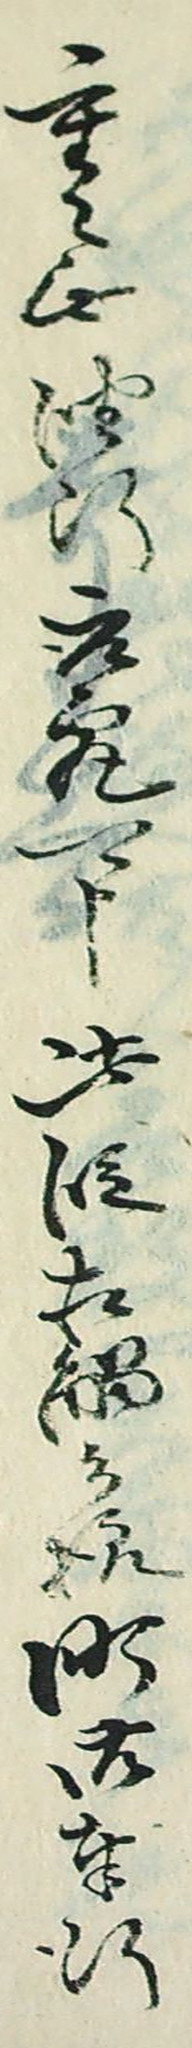重々無油断取究可申此段相觸候様町御奉行
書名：諸御趣意書并御下知向之写
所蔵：鳴門教育大学 Naruto University of Education
